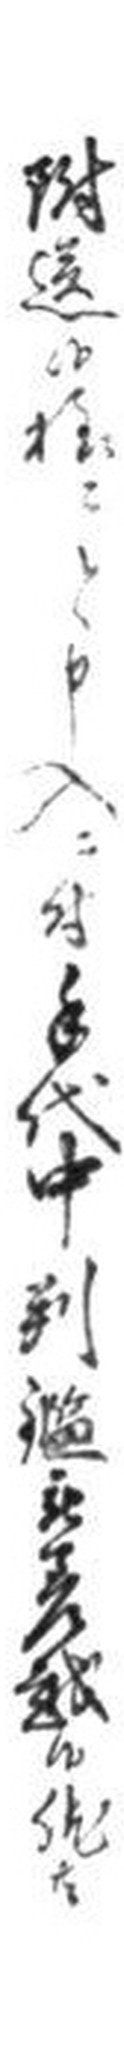付送候様ニと申入ニ付手代中判鑑被差越候然共
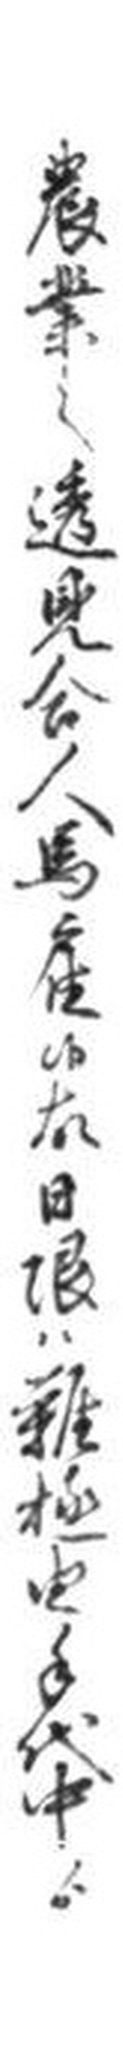農業之透見合人馬雇候故日限ハ難極由手代中ゟ
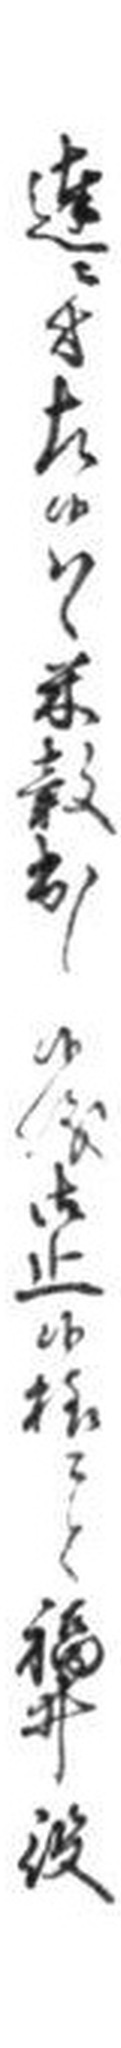達ニ付左候ハヽ米穀出し候儀御止候様ニと福井役
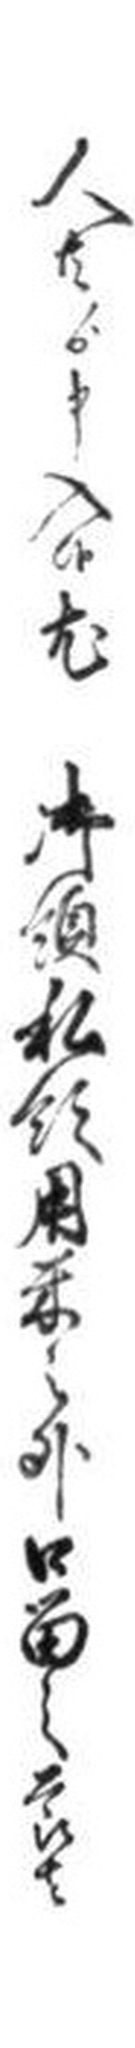人共ゟ申入候尤御領私領用米之外口留之節者
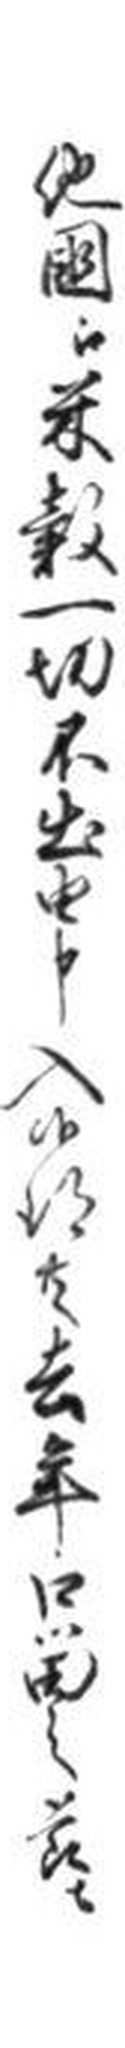他国江米穀一切不出由申入候得共去年口留之節者
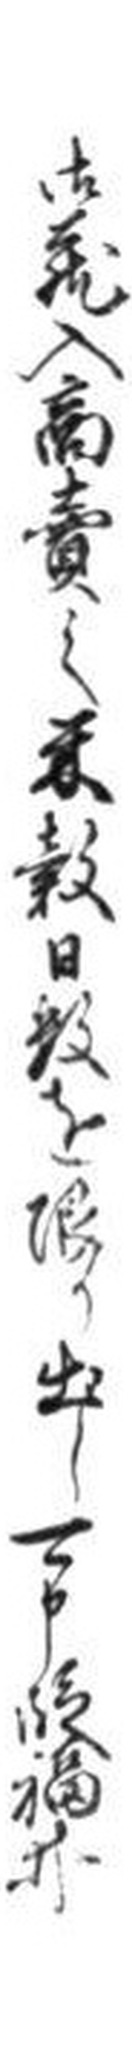御蔵入商売之米穀日数を限り出し可申段福井
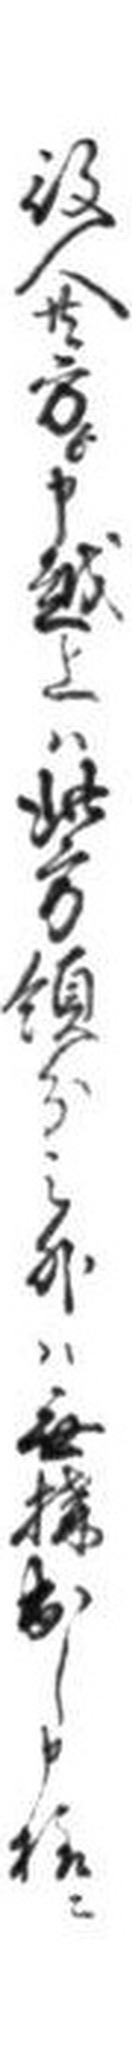役人共方ゟ申越上ハ此方領分之外ハ無構出し申様ニ
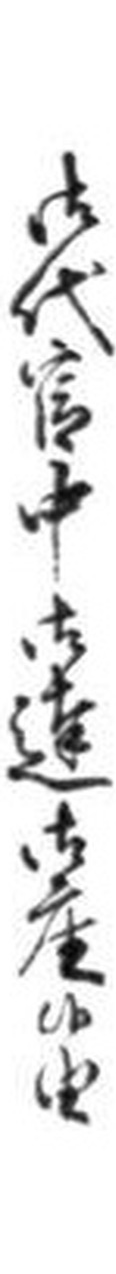御代官中御達御座候由
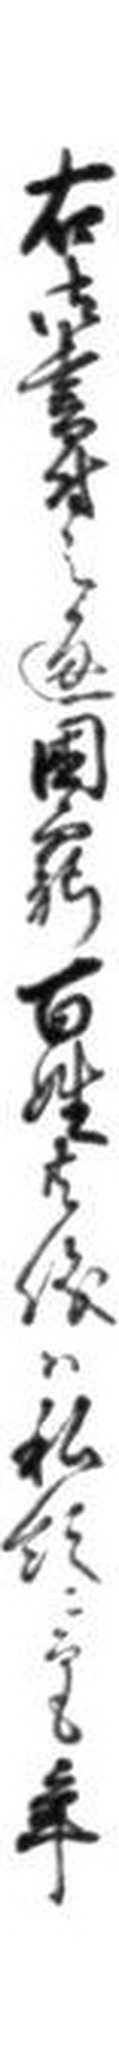右御書付之通困窮百姓共儀ハ私領ニ而も年
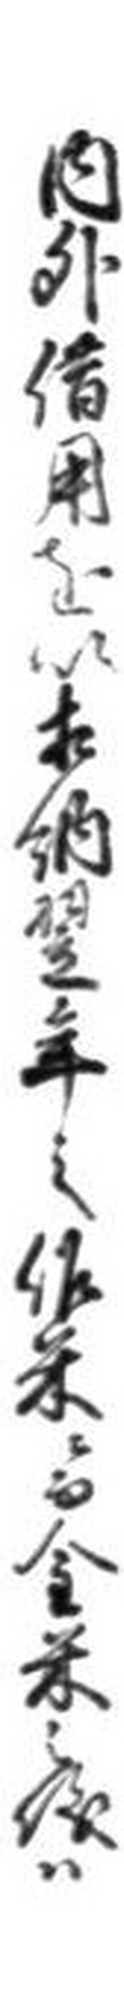内外借用を以相納翌年之作米ニ而金米之儀ハ
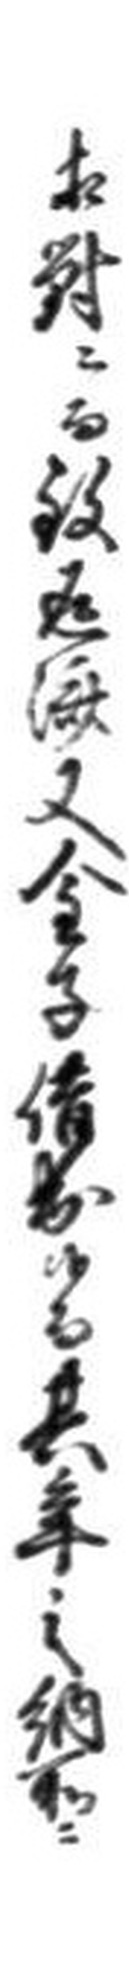相対ニ而致返済又金子借出候而其年之納所ニ
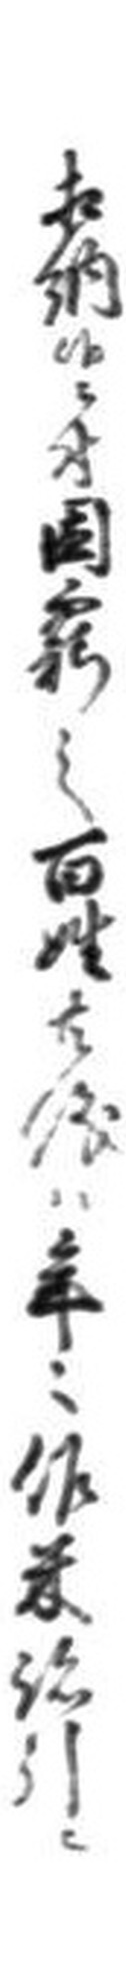相納候ニ付困窮之百姓共儀ハ年々作米跡引ニ
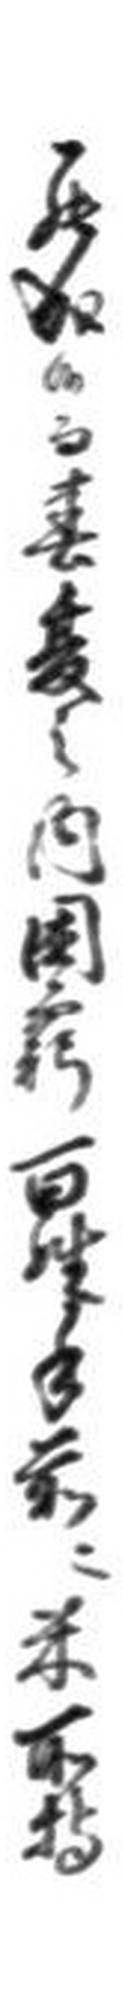罷成候而春夏之内困窮百姓手前ニ米所持
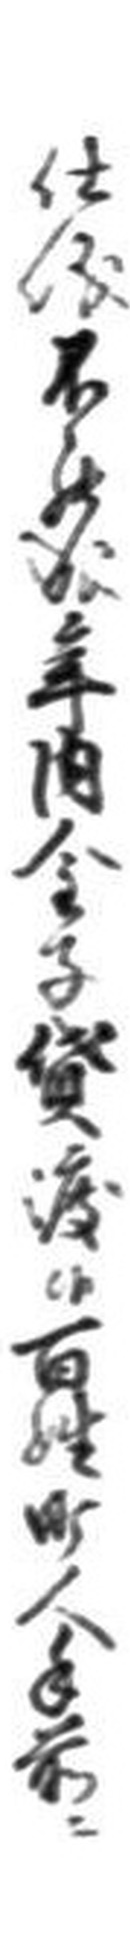仕儀不罷成年内金子貸渡候百姓町人手前ニ
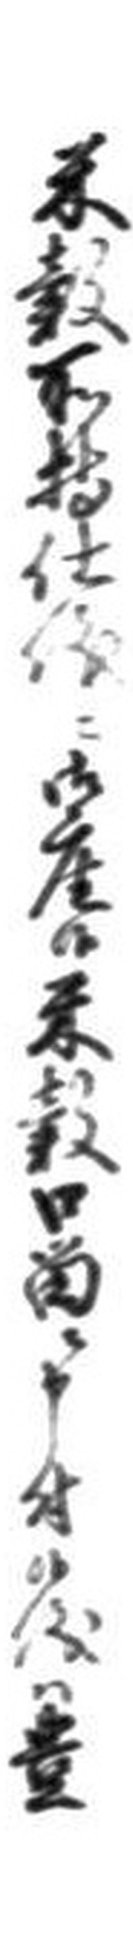米穀所持仕儀ニ御座候米穀口留ニ申付候儀ハ豊
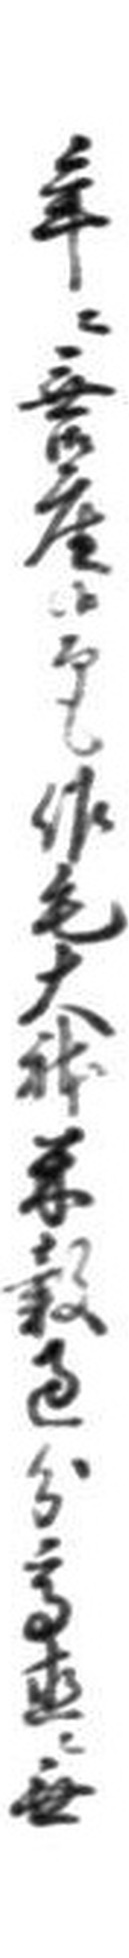年ニ無御座候而も作毛大体米穀過分高直ニ無
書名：家譜 二十二 吉品公 従元禄十五年到同十六年
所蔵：福井県文書館 Fukui Prefectural Archives
